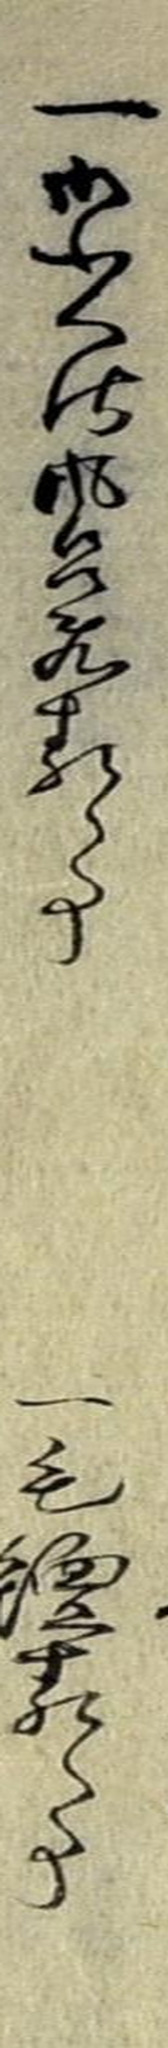一御ふくさ風呂敷類之事一毛氈類之事
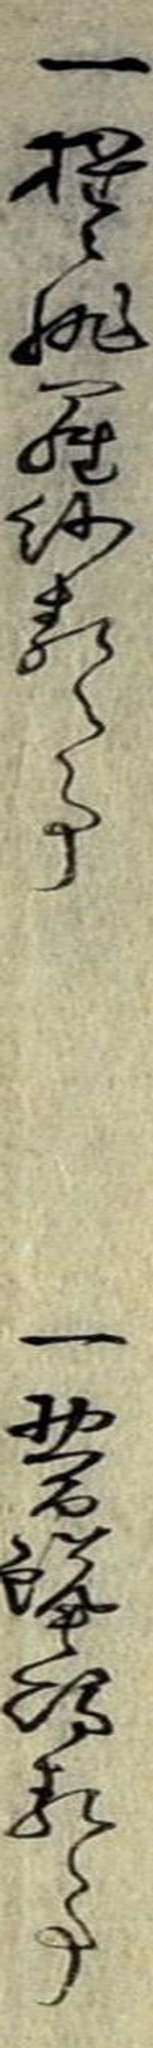一猩々緋羅紗類之事一惣而蝋燭類之事
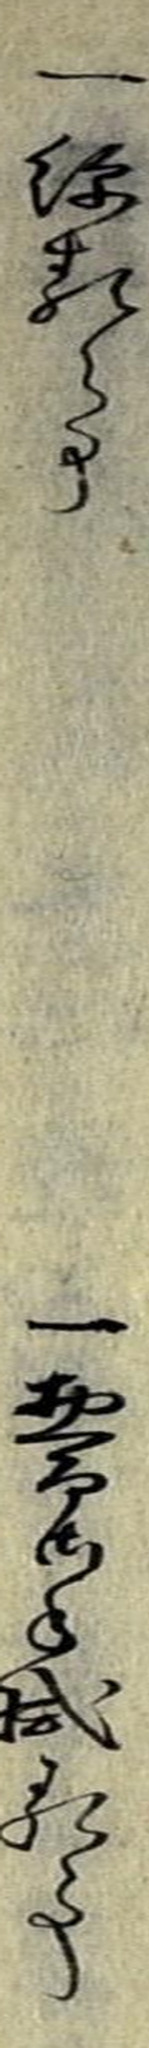一綿類之事一惣而御手拭類之事
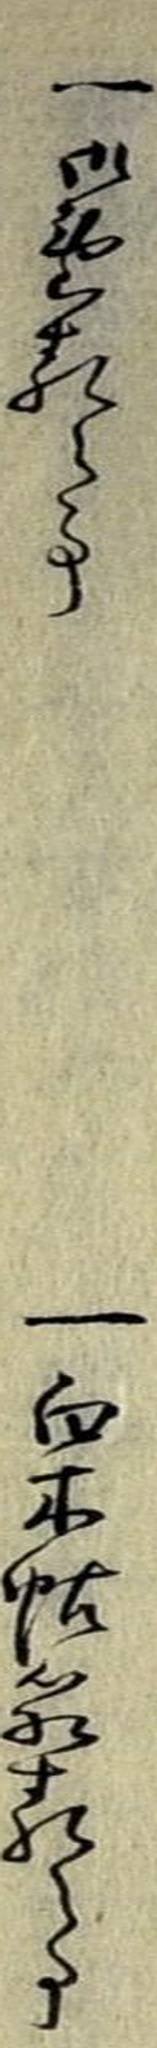一御䑓類之事一白木帖箱類之事
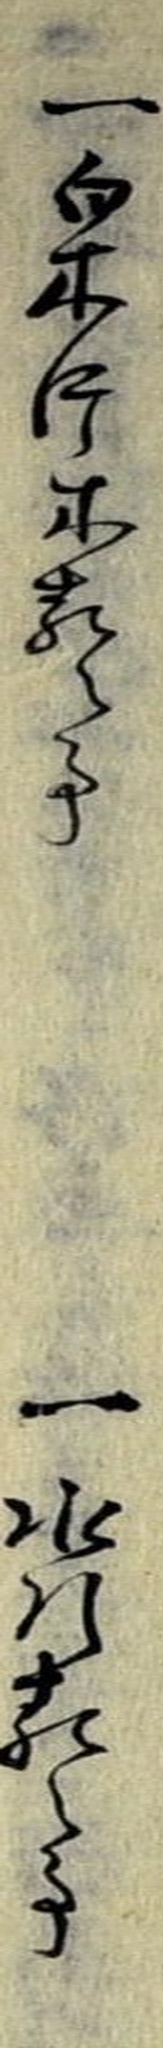一白木片木類之事一水引類之事
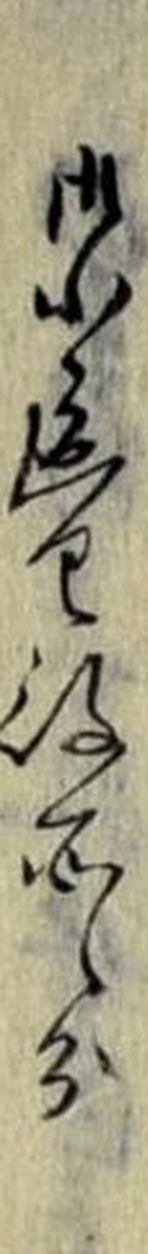御小道具役所之分
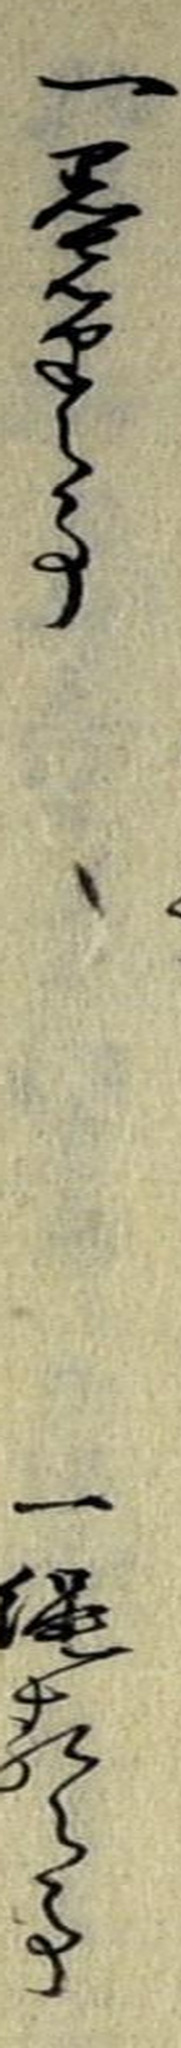一墨筆之事一縄類之事
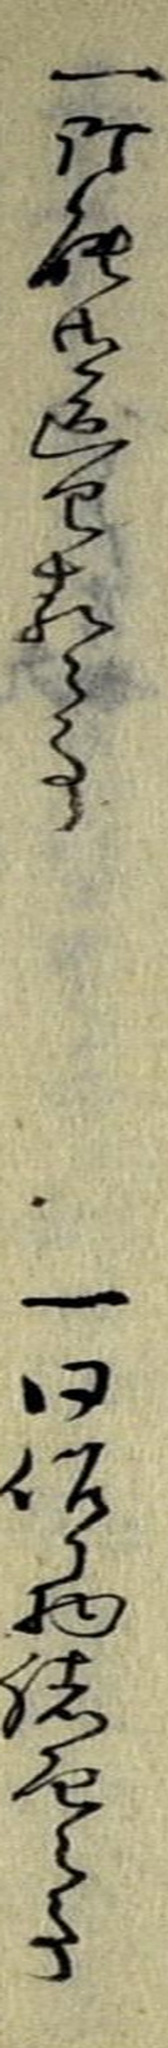一御能御道具類之事一同作り物諸色之事
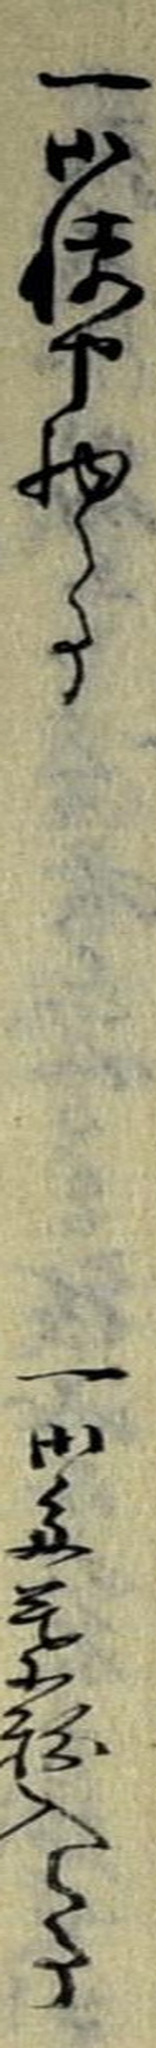一御懐中物之事一御多葉粉入之事
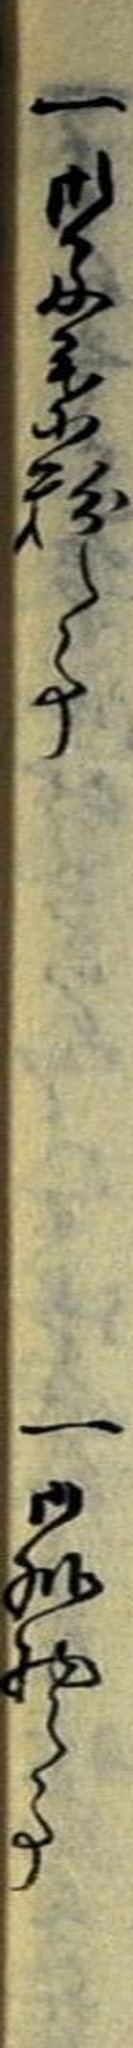一御多葉粉之事一御掛物之事
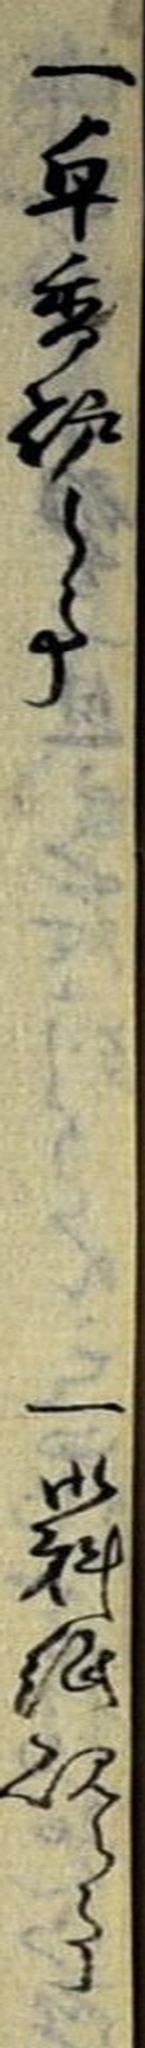一卓香炉之事一御料紙硯之事
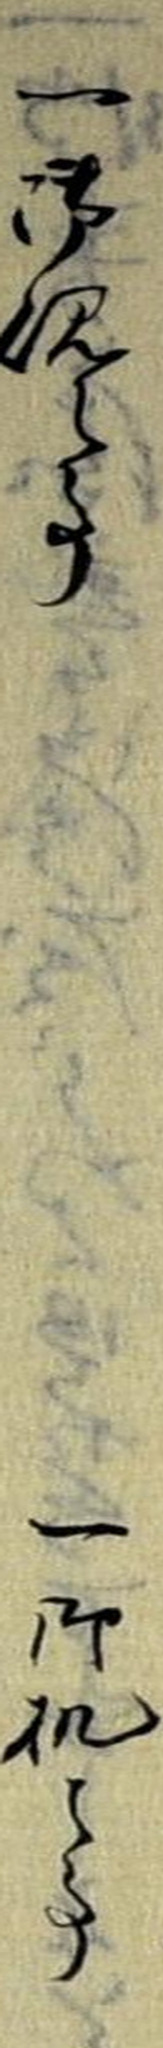一御硯之事一御机之事
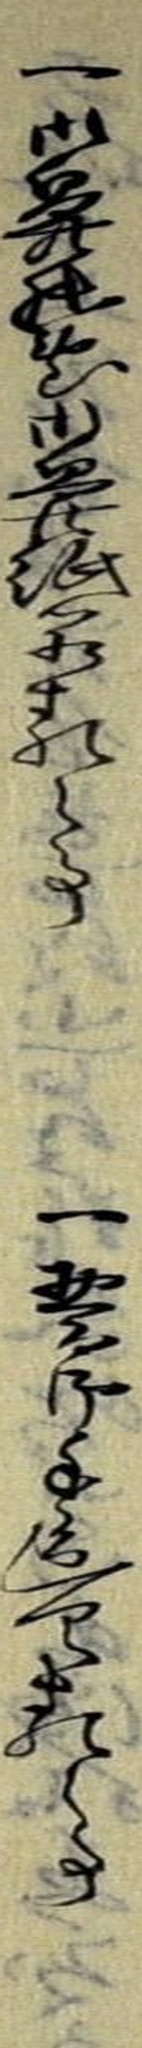一御鼻紙䑓御鼻紙箱類之事一惣而御手道具類之事
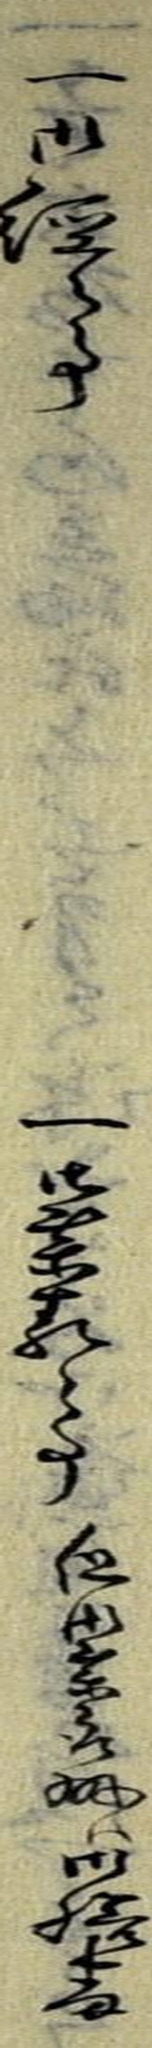一御経之事一御薬類之事但御薬取扱は御膳番
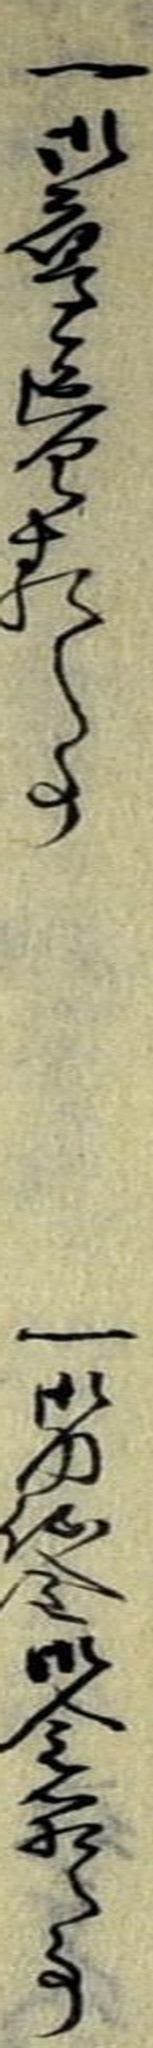一御鷹道具類之事一御内証金御金箱之事
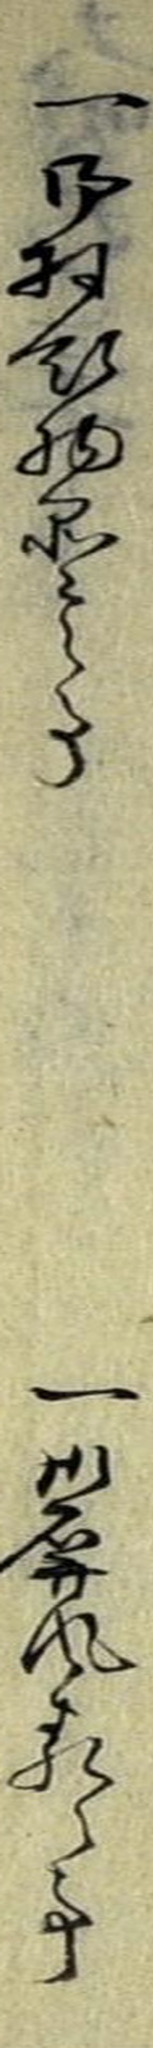一御拝領物品々之事一御屏風類之事
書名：命令之部 二
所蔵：福井県文書館 Fukui Prefectural Archives
